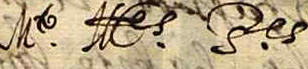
Mto. Illes. S.res
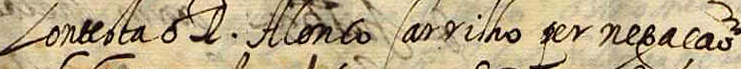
Contesta o R. Alonço Carrilho per negaçaõ
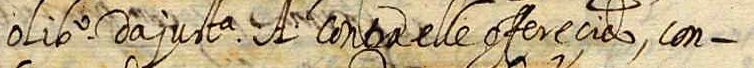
o Lib.o da just.a A. contra elle offerecido, con
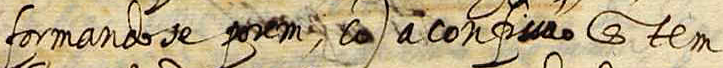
formandose porem, cō a confissão q̄ tem
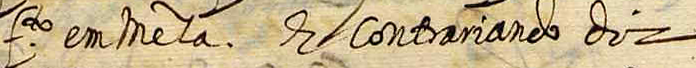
f.to em MeZa. E contrariando diz
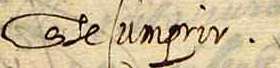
q̄ se Cumprir.
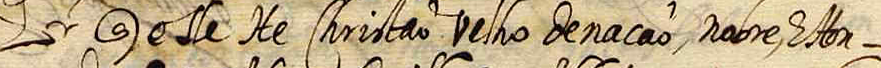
Pr̄ q̄ elle He Christaõ velho de naçaõ, nobre, E Hon
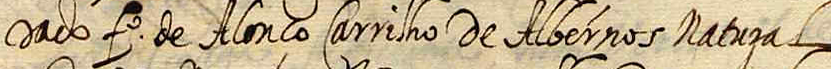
rado fo. de Alonço Carrilho de Albernos naturaL
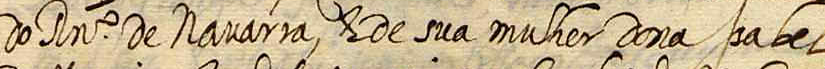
do Rn.o de Nauarra, E de sua mulher dona JsabeL
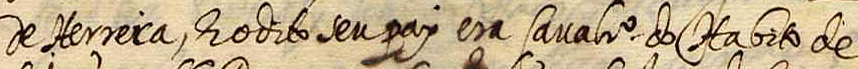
de Herrera, E o dito seu pay era Caualro. do Habito de
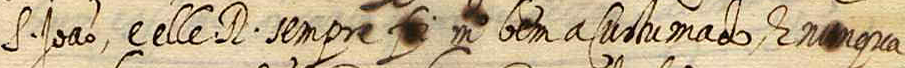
S. Joaõ, e elle R. sempre foi mto bem aCustumado, E nunqua
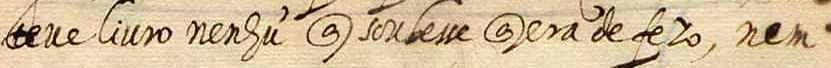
teue liuro nenhū q̄ soubesse q̄ era defezo, nem
